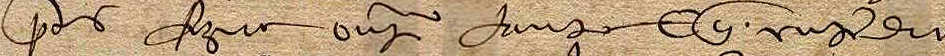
p̄tes fizera outro tanto E q̄ entēdia
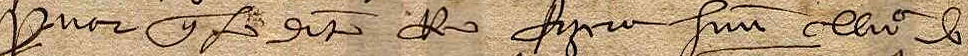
ꝓuar q̄ ho dito Reo fizera huū allua do
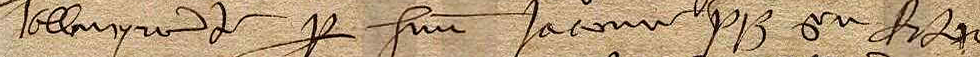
allmyrāte ꝑ huū Jacome p̄jz seu fejtor
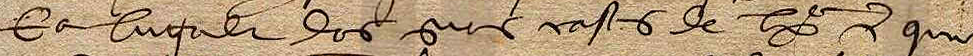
E alugador das suas casas de lxa ē que
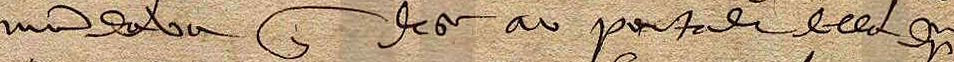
mādava q̄ dese ao portador della drro
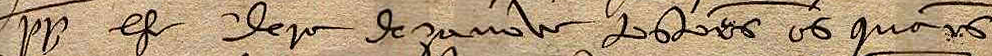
p̄jz lhe dera dezanove tostoẽs os quaes
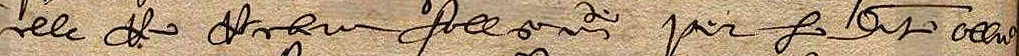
elle Reo Recebera fallsamte per ho dito allua
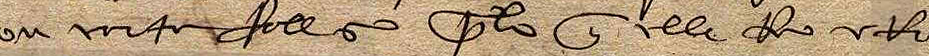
ou carta fallso p̄lo q̄ elle Reo eRa
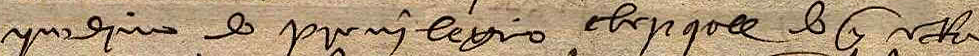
ymdjno do preujlegio cleriqall do q̄ eRa
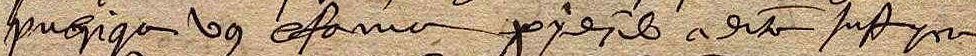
pubriqa vꝯ e fama pydīdo a dita Justyça
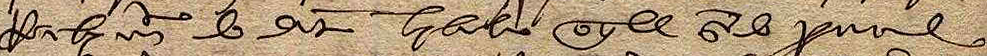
Recebymto do dito lybelo o q̄ll sēdo ꝓuado
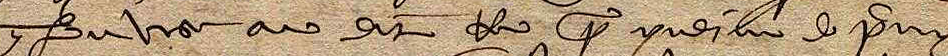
q̄ houvese ao dito Reo p̄o yndino do p̄uy
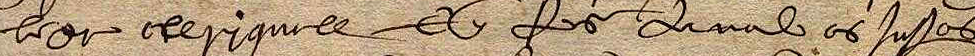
legio cleryquall E q̄ fose tornado as Justas
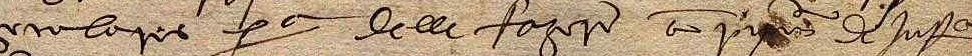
seculares ꝑa delle fazerē c̄oprymto de Justa
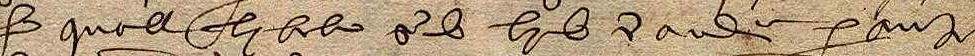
ho quall lybelo sēdo lydo ē auda ꝑante
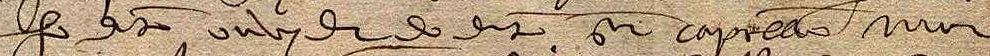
ho dito ouvydor do dito s̄or capellão mor
